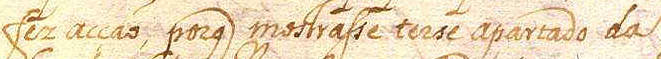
fez acçaõ, porq̄ mostrasse terse apartado da
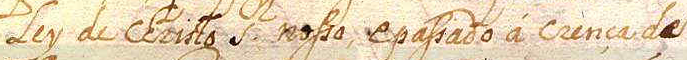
Ley de christo s.or nosso, e passado á crença de
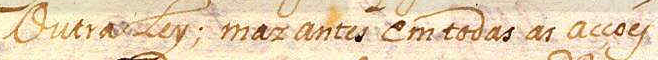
Outra Ley; maz antes em todas as acçoẽs
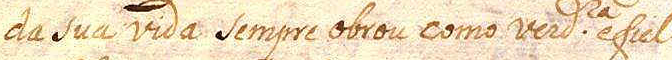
da sua vida sempre obrou como verd.ra e fiel
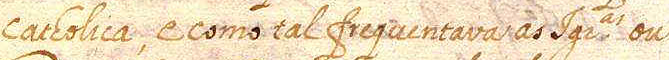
catholica, e como tal frequentava as Igr.as ou
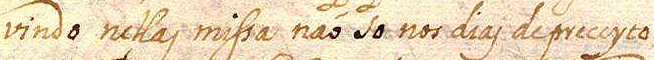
vindo nellas missa naõ só nos dias de preceyto;
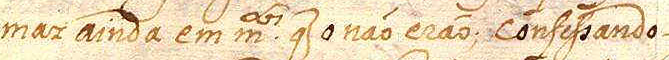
maz ainda em m.tos q̄ o naõ eraõ; confessando
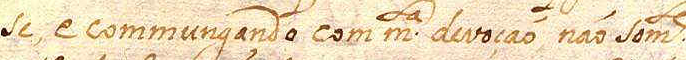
se, e commungando com m.ta devoçaõ naõ som.te
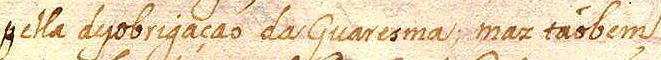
pella desobrigaçaõ da Quaresma, maz taõbem
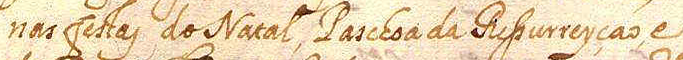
nas festas do Natal, Paschoa da Ressureyçaõ, e
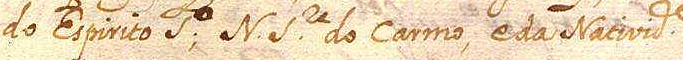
do Espirito sto; N. S.ra do carmo, e da Nativid.e
